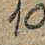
10
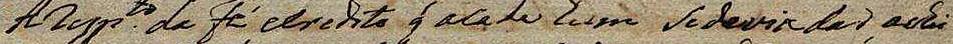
A Resp.to da Fé, e credito q̄ a cada hum se devia dar, achei
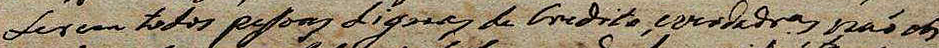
serem todos pessoas dignas de credito, e verdadr.as naõ obs
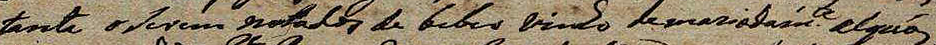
tante o serem notadas de beber vinho demaziadam.te alguās
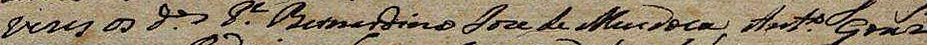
vezes os d.os P.e Bernardino Joze de Mendoça, Anto Gonz̄
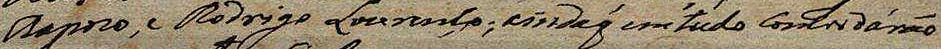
Rapozo, e Rodrigo Lourenço; ainda q̄ em tudo concordaraõ
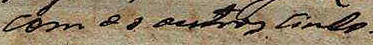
com os outros cinco.
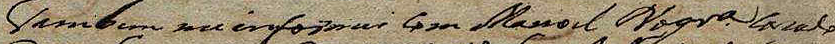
Tambem me informei com Manoel Nogr.a cazado
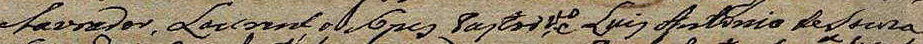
Lavrador, Lourenço lopes Pastor vo, e Luis Antonio de Souza
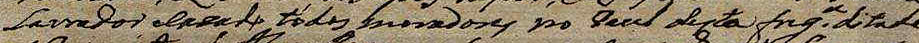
Lavrador e cazado todos moradores no Paul desta freg.a dita de
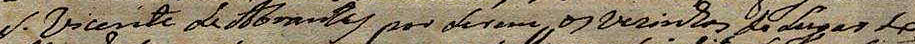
s. Vicente de Abrantes por serem os vezinhos do Lugar do
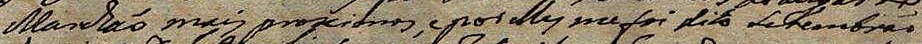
Marchaõ mais proximos, e por elles me foi dito se lembraõ
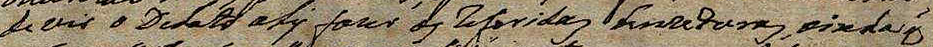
de vir o Delato ahy fazer as Referidas benzeduras, ainda q̄
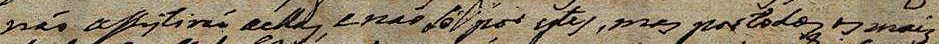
não assistiraõ a ellas, e naõ só por estes, mas por todos os maiz
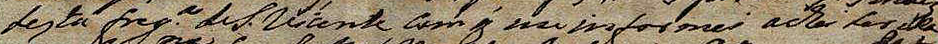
desta freg.a de S. Vicente, com q̄ me informei achei ser Ma
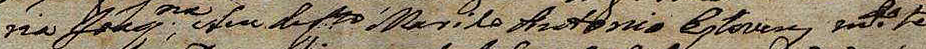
ria Joaq;na e seu dfto Marido Antonio Estevens m.to te
